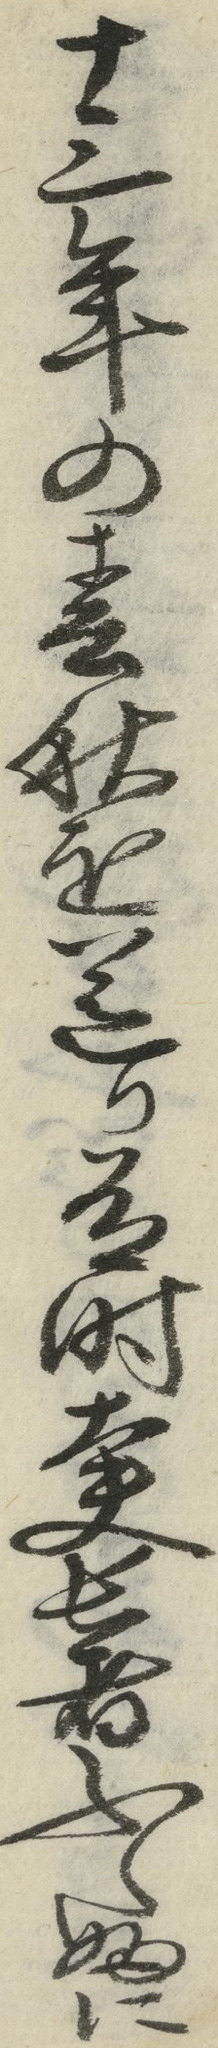十三年の春秋を送り有時大夫長者ふう婦に
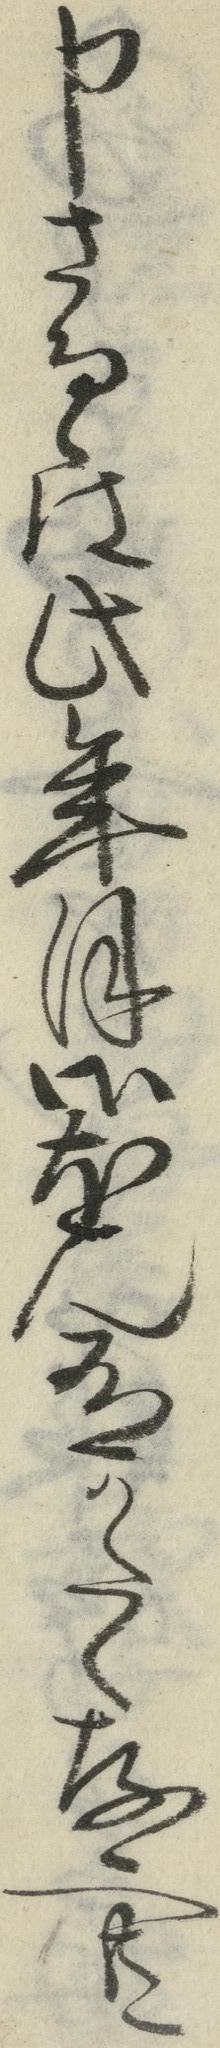申しさるゝは此年月御をん有かたく存候へ共
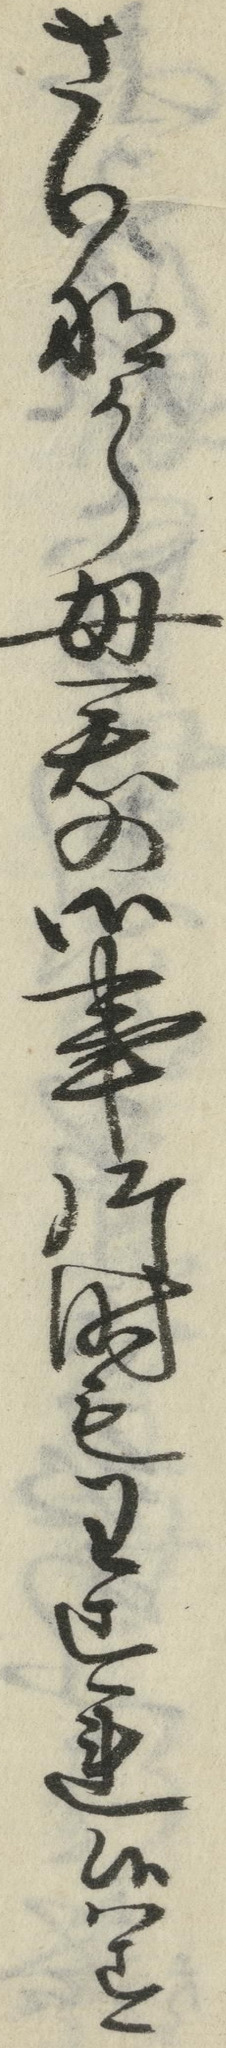さりなから母君の御事片時もわすれ候わす
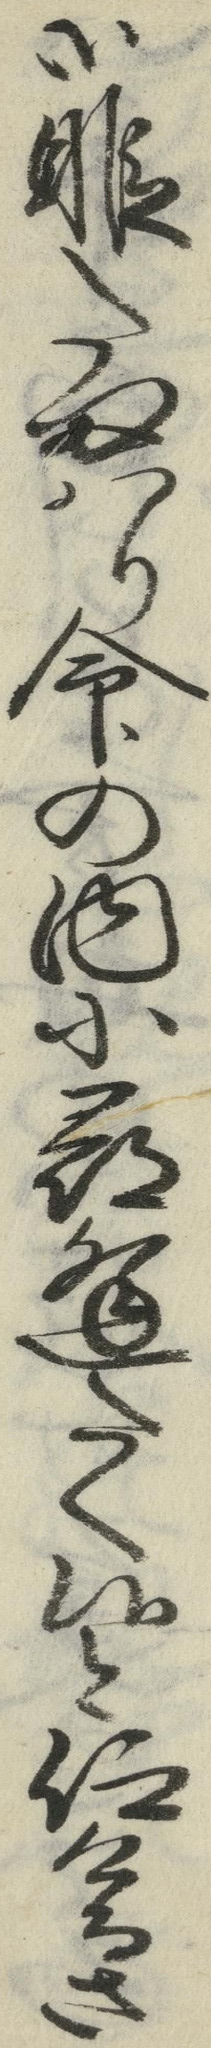御暇たまハり命の内に尋逢たく候と仰けるさ
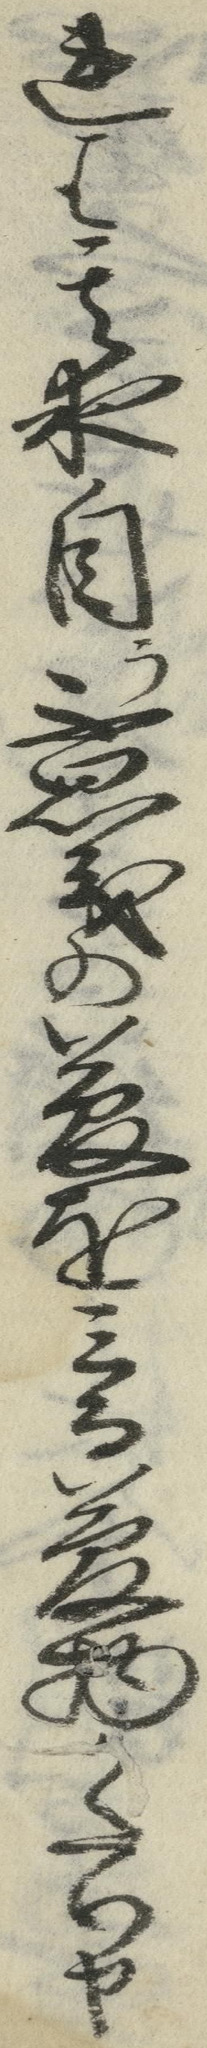れは其夜自ラ不思議の夢をミる夢物かたり申
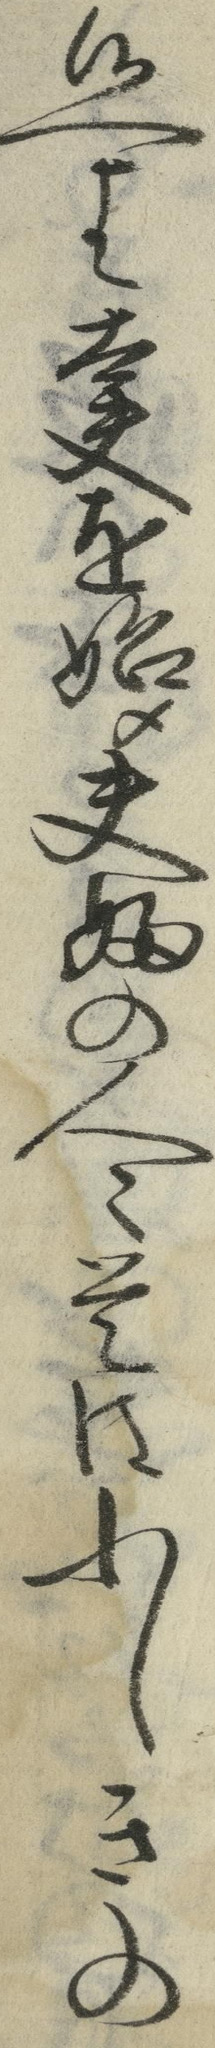候へは太夫を始メ夫婦の人〻是はふしきの
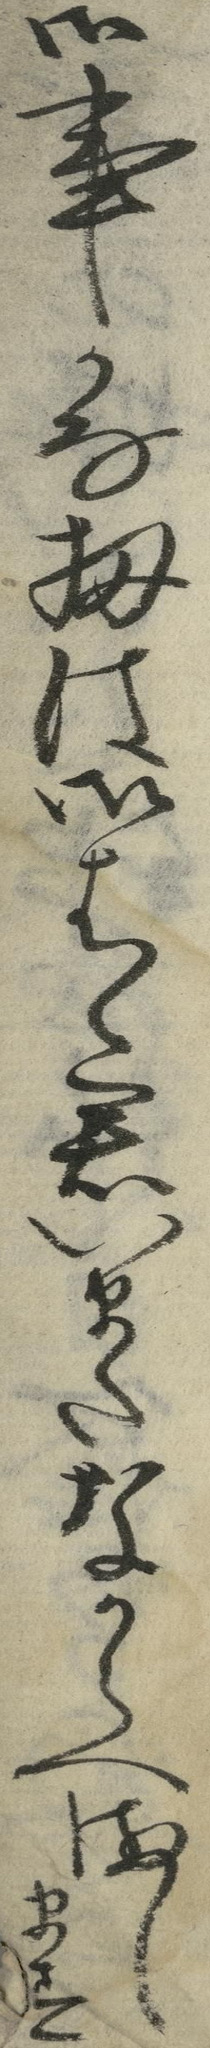御事かな扨は御はゝ君いまたなからへまします

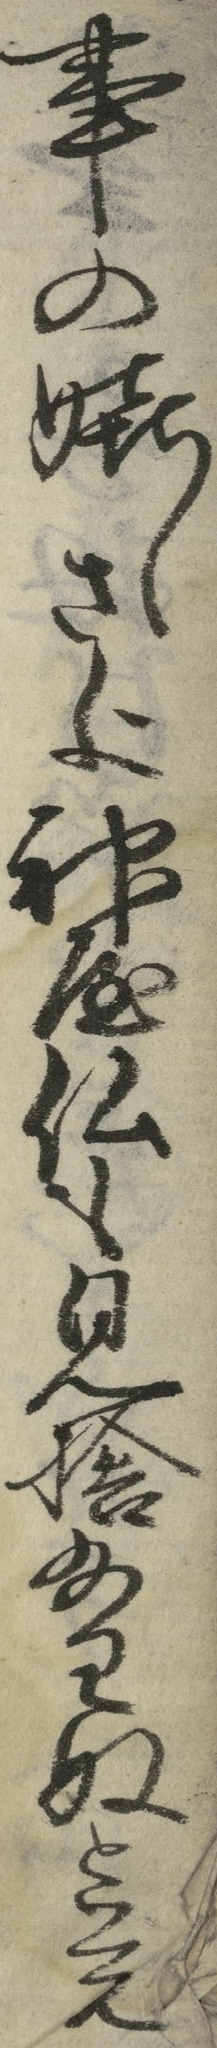事の嬉しさよ神や仏も見捨給わぬと覚
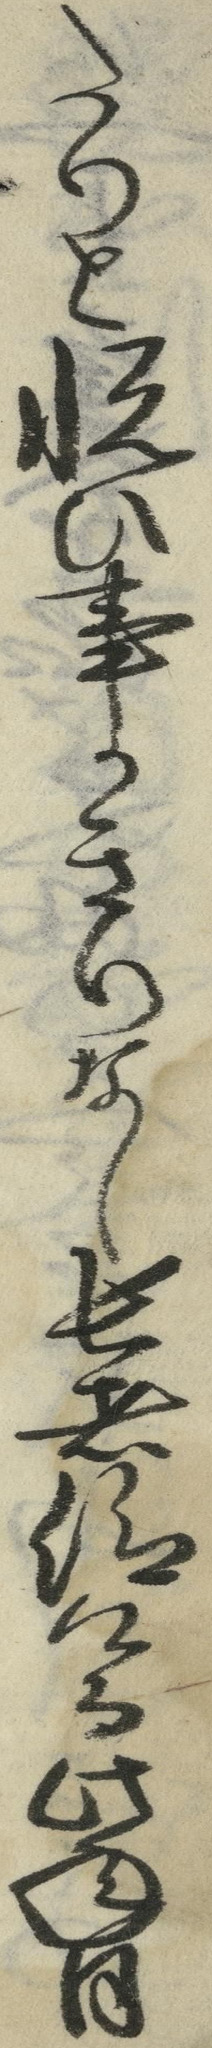たりと悦ひ事かきりなし長者仰ける此年月
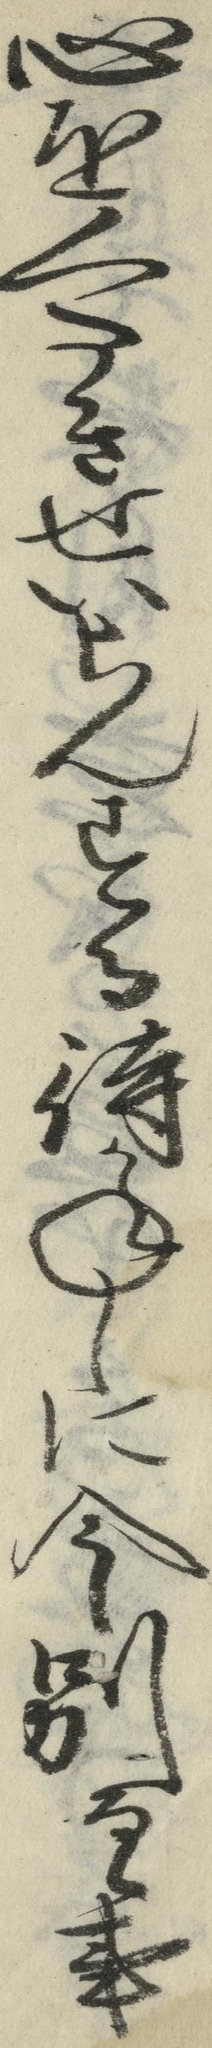心をくたきせいちんする待かねしに今別るゝ事
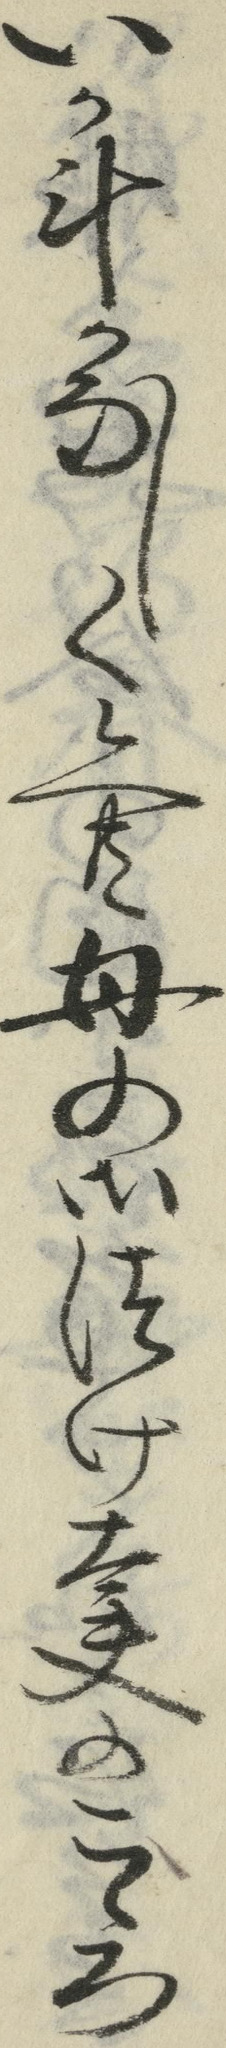いか斗かなしく候へ共母の御つけ太夫のこゝろ
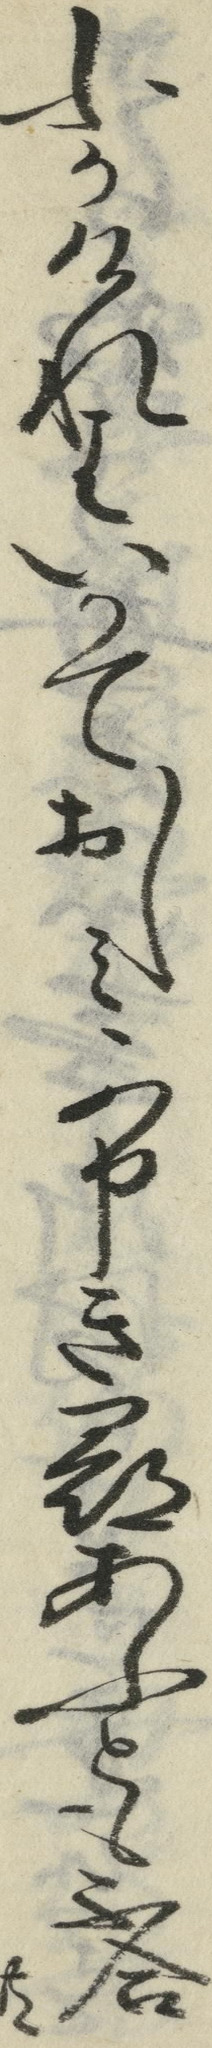ふかけれはいかておしミ可申き尋あふとも不合共
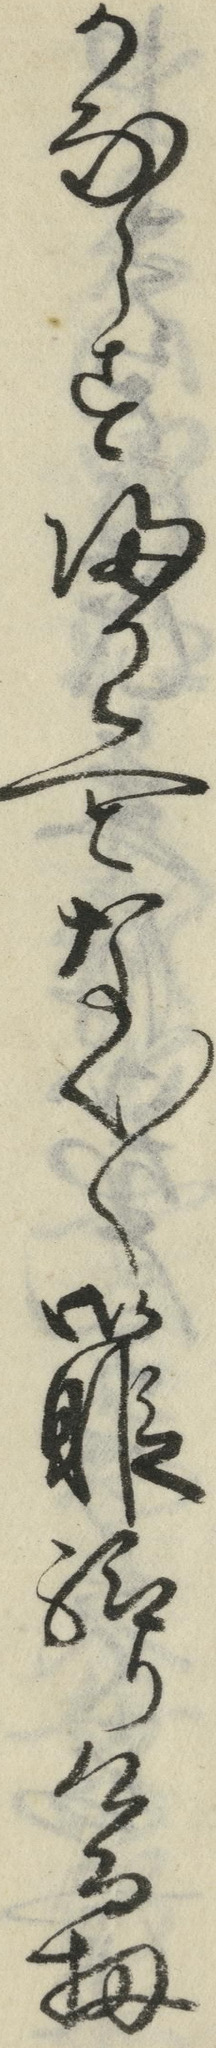かならす帰り候へとなく〳〵御暇給りける扨
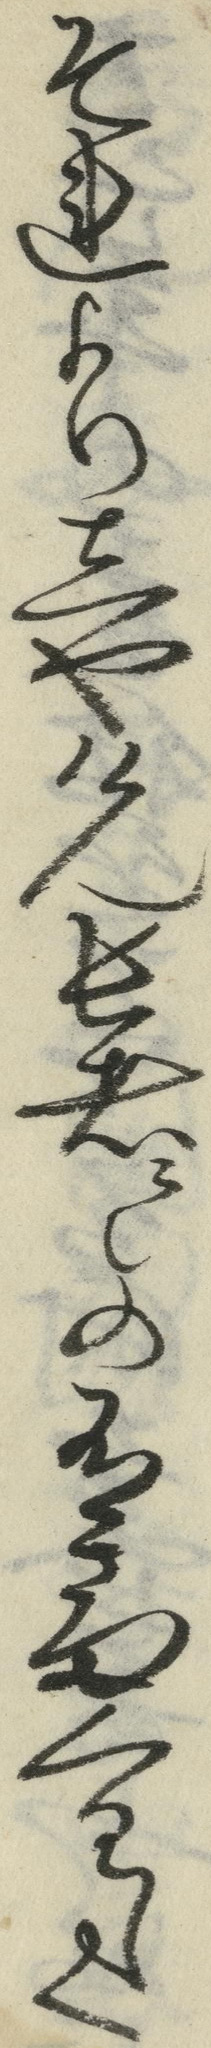それよりしやけん長者ニて？の有さまくわしく
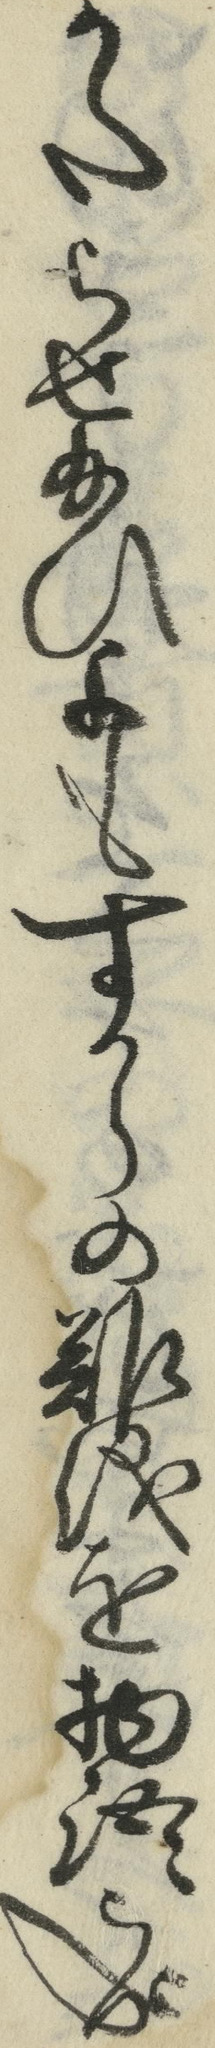かたらせ給ひよもすからの難儀を物語被成
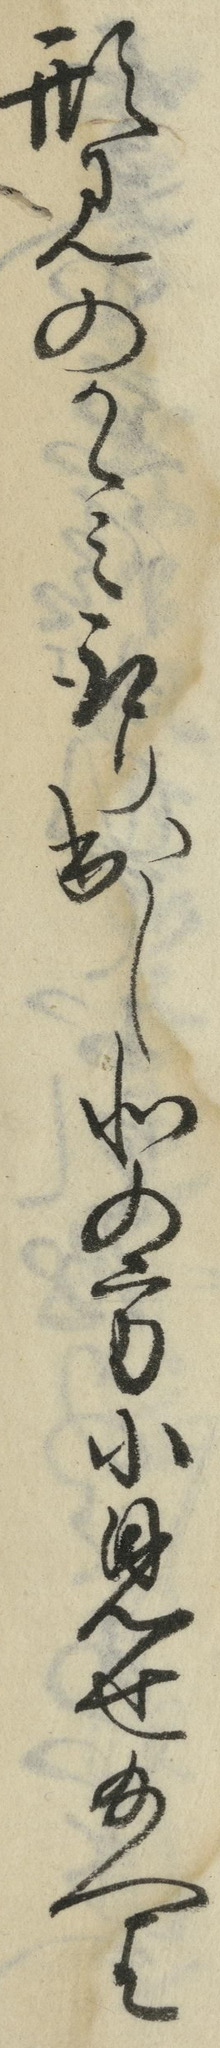形見のかゝミ取り出し北の方に見せ給へは
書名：浅間記
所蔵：東京大学地震研究所図書室 Earthquake Research Institute Library, The University of Tokyo, JAPAN
